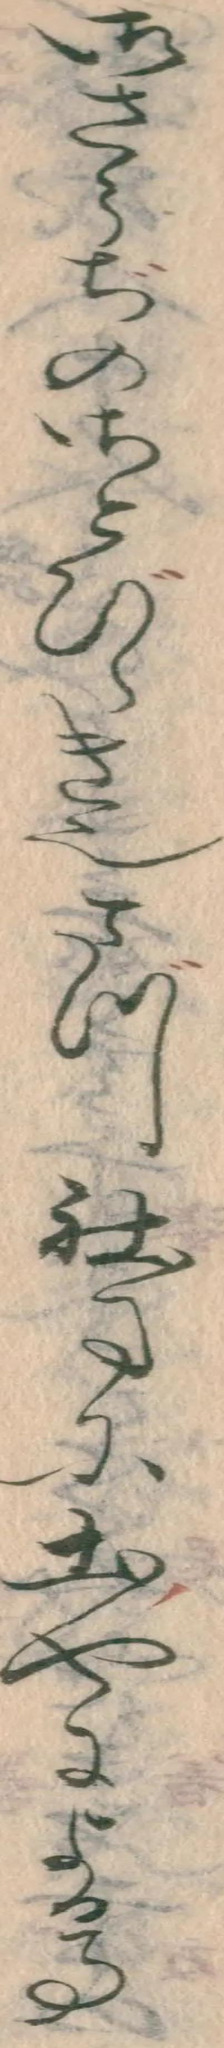御さうぢの御とびらき也まづ社司に土事
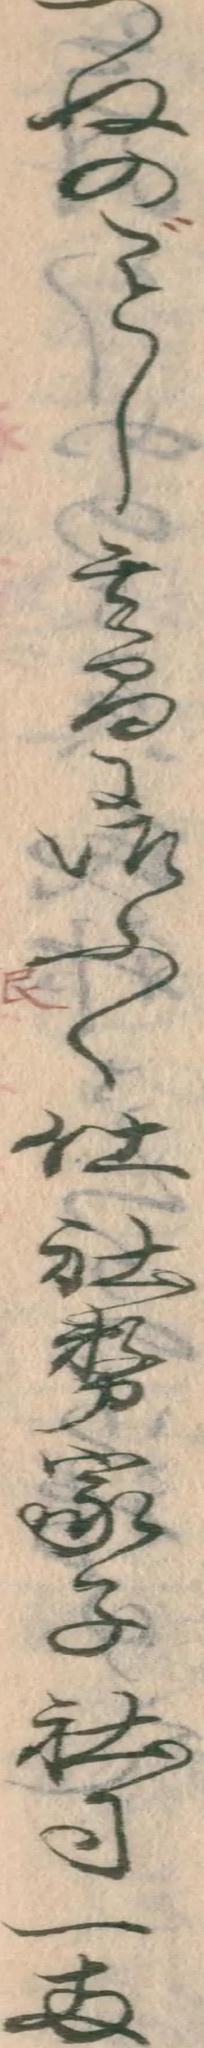つねのごとし其間に御ふく仕社務家子社司一両
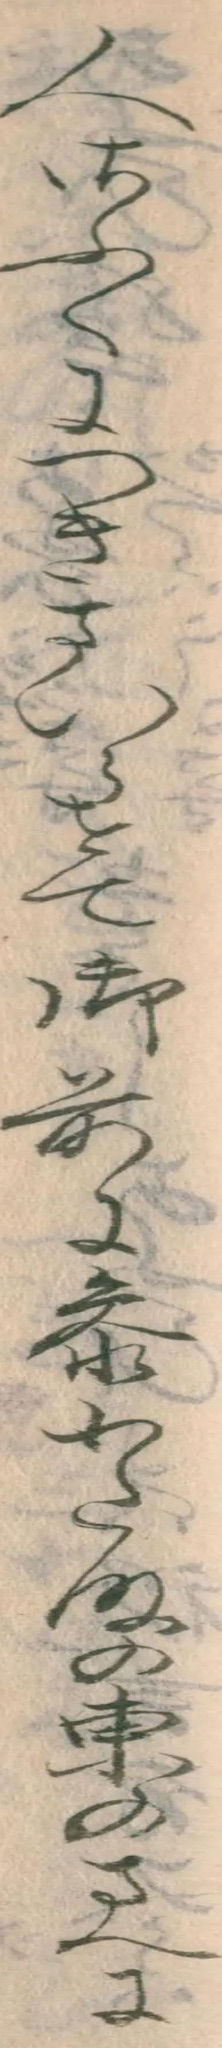人御ふくにつきまいらせて御前に参わた殿の東のまへに
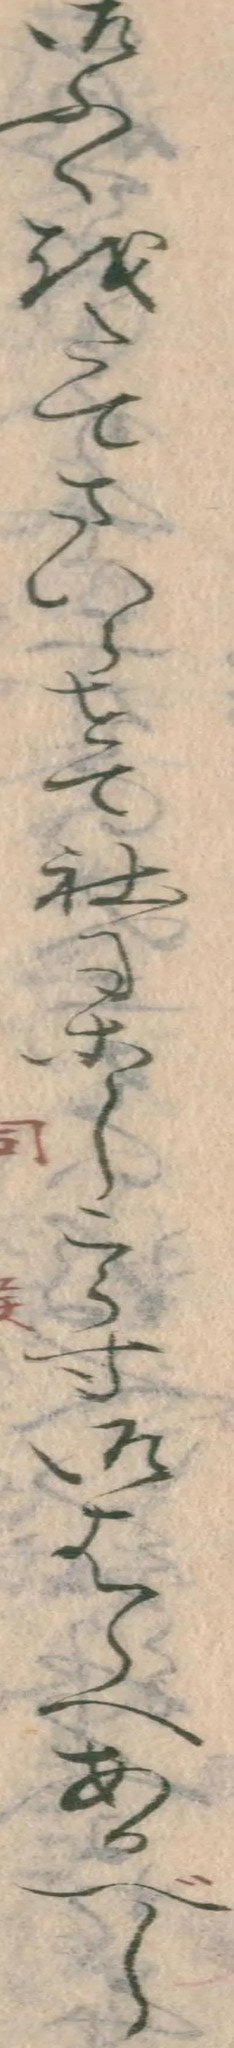御ふくをたてまいらせて社司等しこうす御はらへあるべし
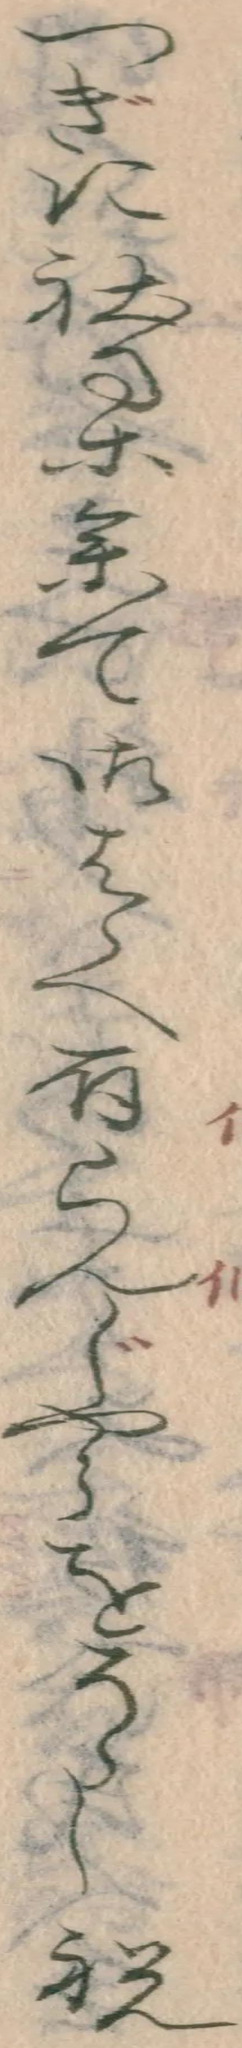つぎに社司等参て御はらへ有らんじやうをそうし祝
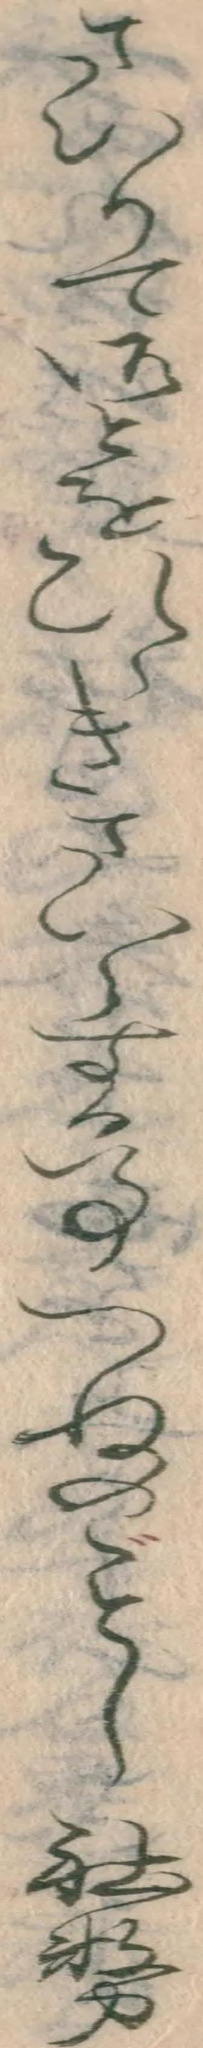まいりて御とをひらきまいらする事つねのごとし社務
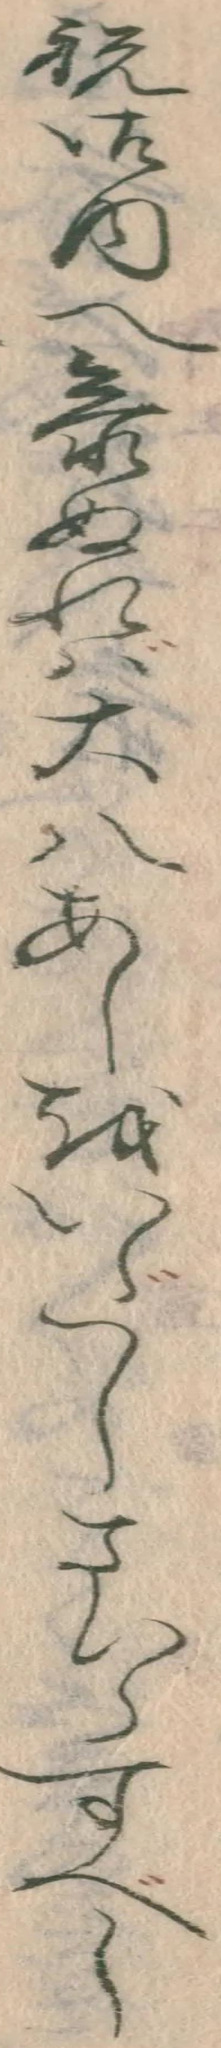祝御内へ参ぬれば大八あしをいだしまいらすべし
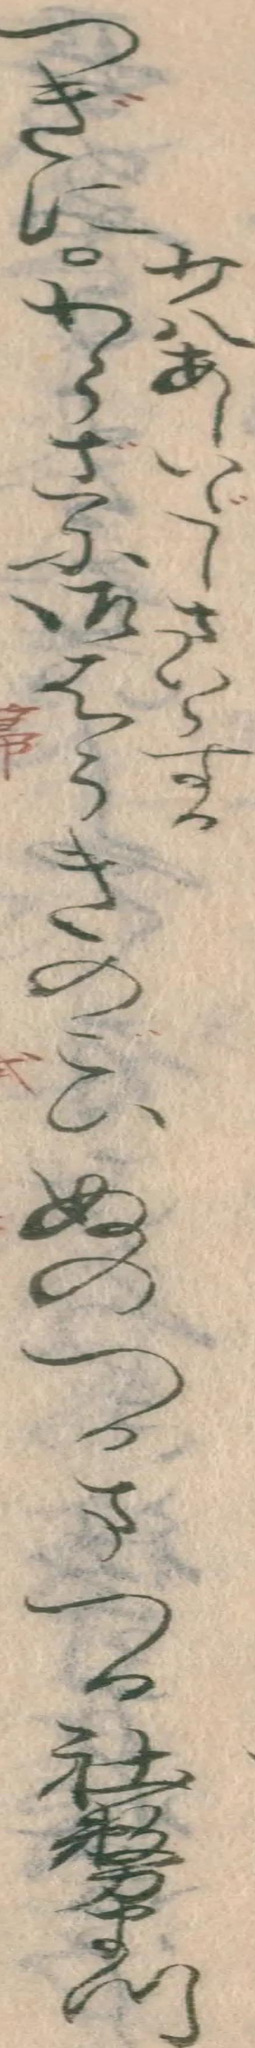つぎに◦わうざに御はうきのごひぬのつかまつる社務まつ
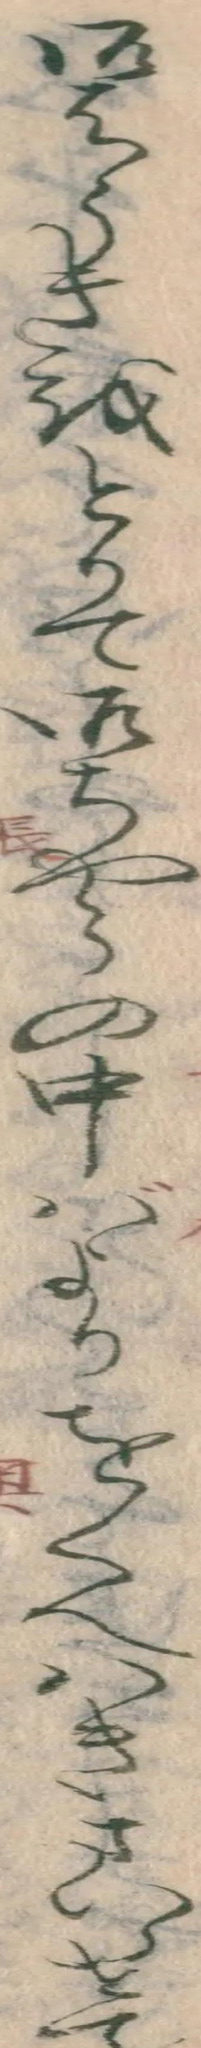御はうきをとりて御ちやうの中ばよりをくへはきまいらせて
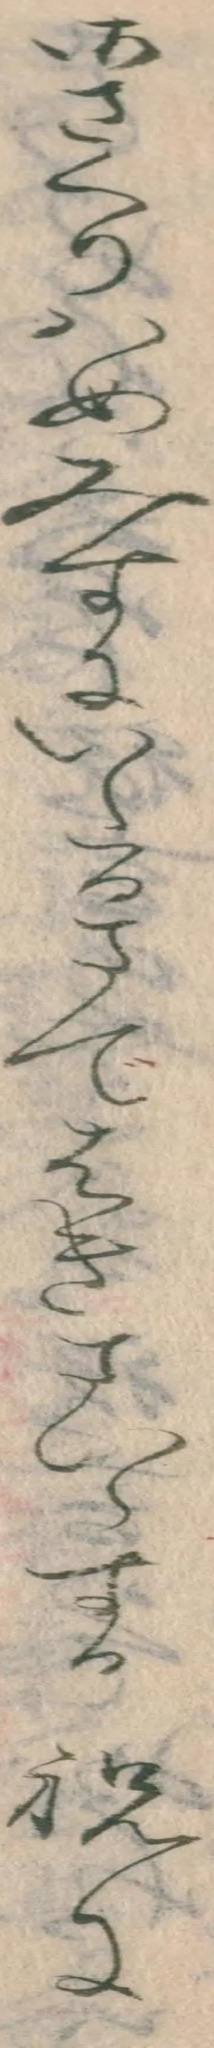御まくりはめみすにいたるまではきまいらする祝に
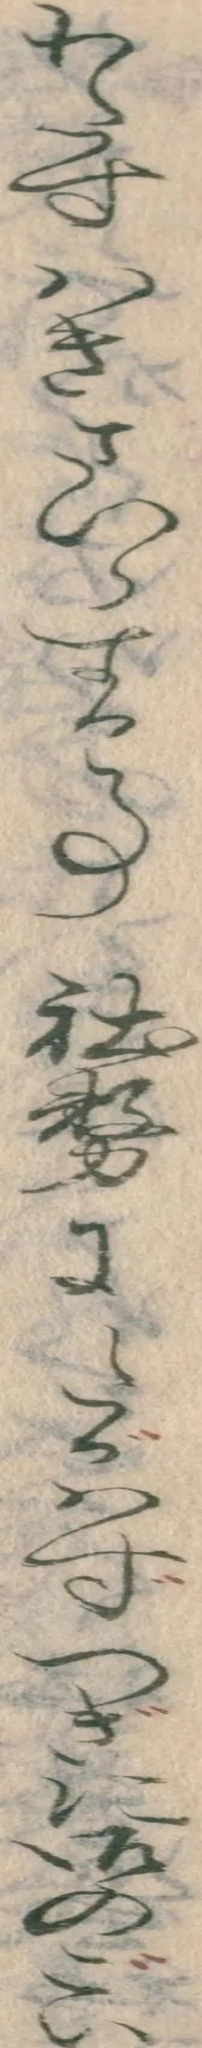わたすはきまいらする事社務にたがはずつぎに御のごい
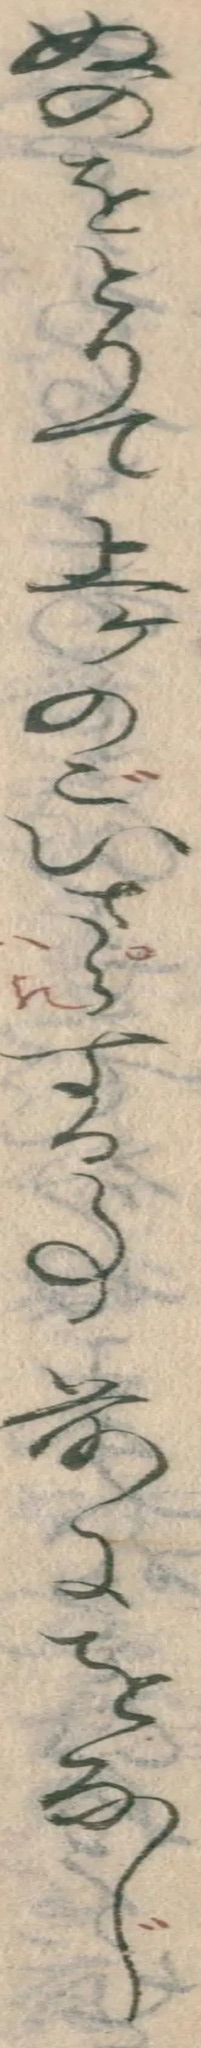ぬのをとりて上ヶのごいまうする事前にをなじ
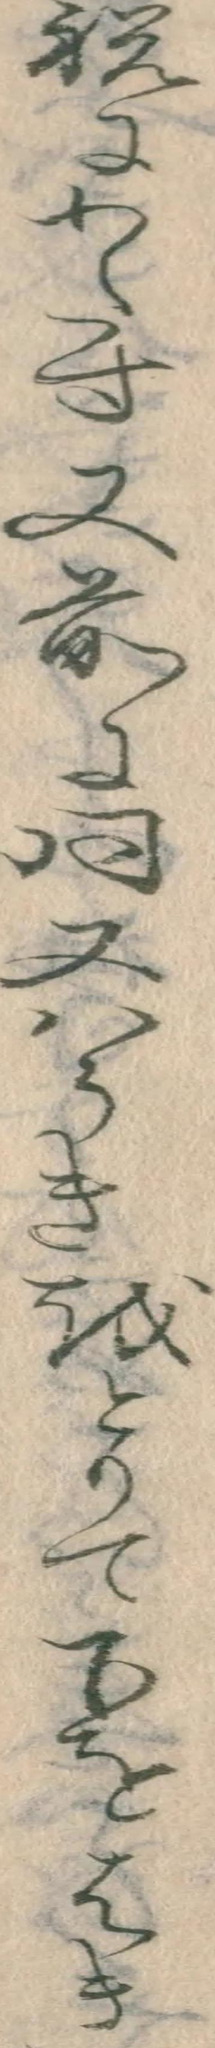祝にわたす又前に同又はうきをとりて下をはき
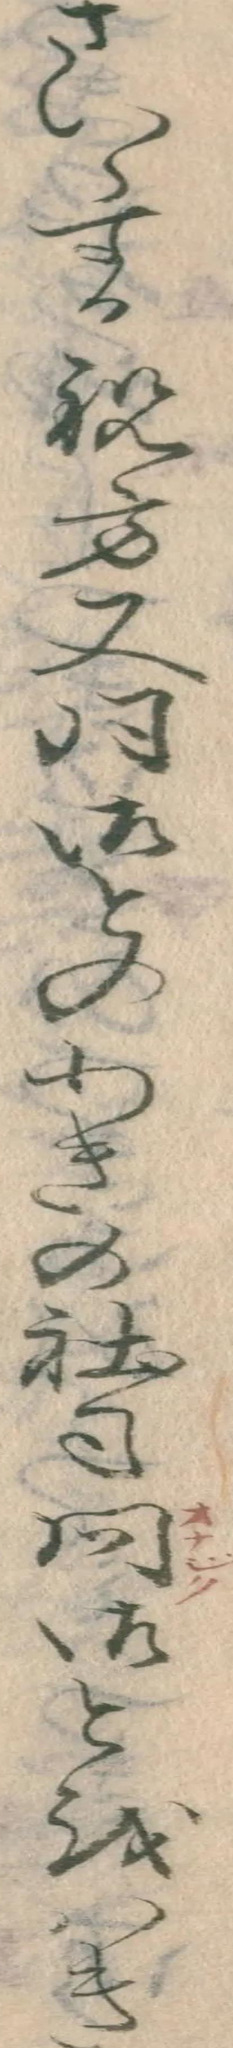まいらする祝方又同御とのわきの社司同御とをはき
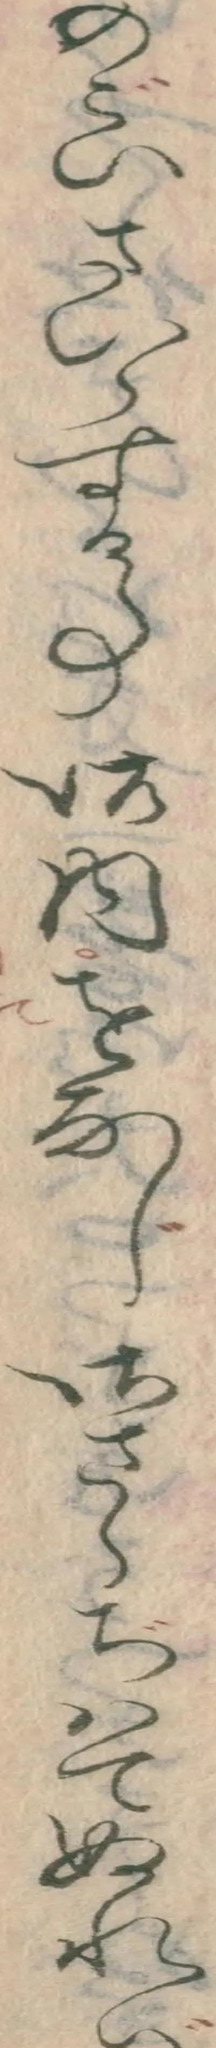のごいまいらする事御内◦をなじ御さうぢはてぬれば

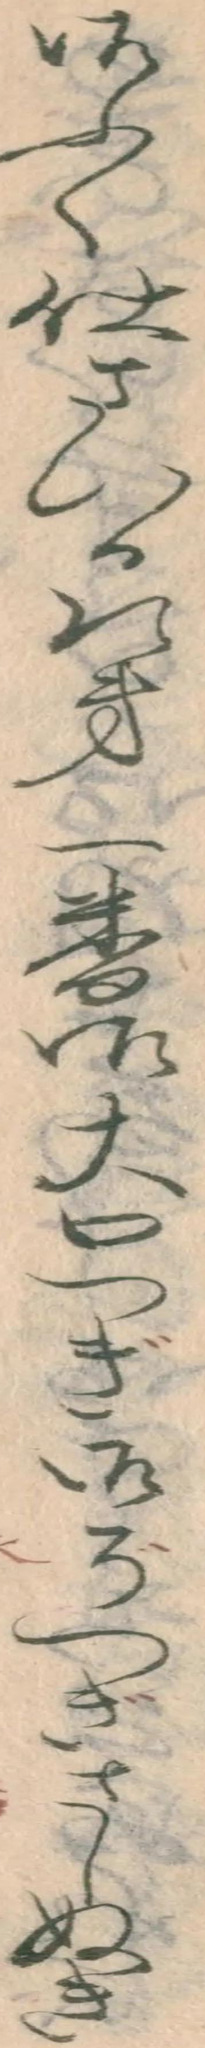御ふく仕まいる次第一番御大口つぎ御ぞつぎさしぬき
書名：賀茂社記録. 第3冊
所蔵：国立国会図書館 National Diet Library, JAPAN
